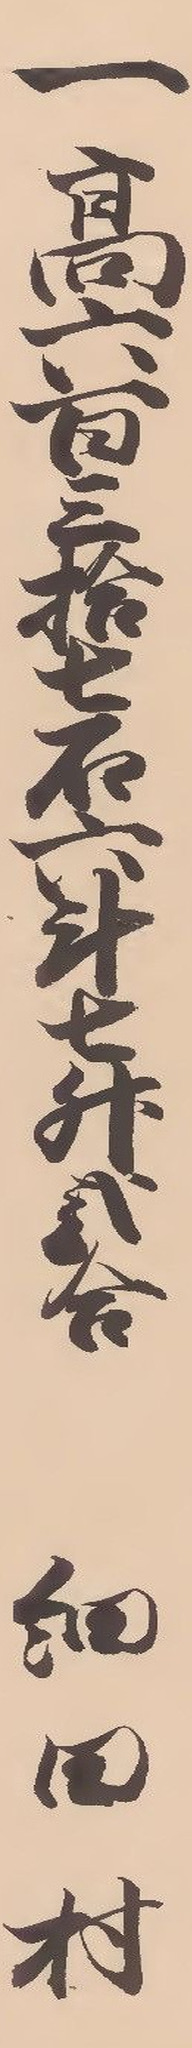一高六百三拾七石六斗七升弐合細田村
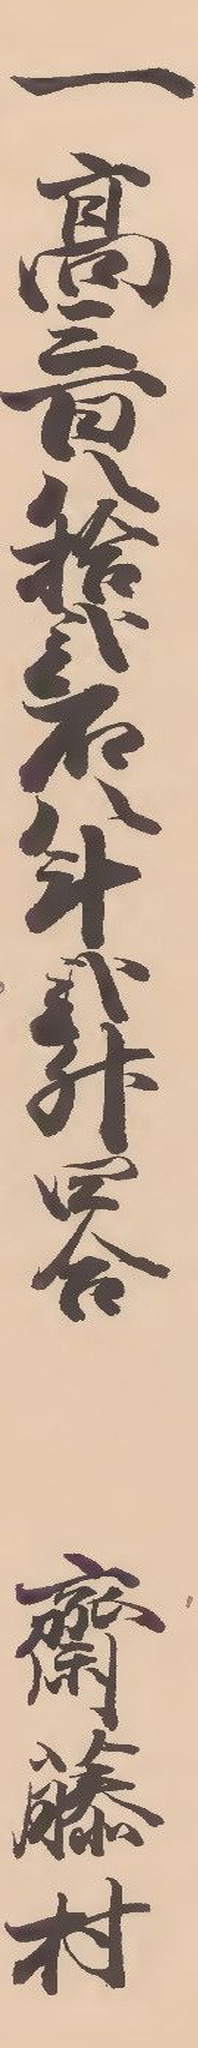一高三百八拾弐石八斗弐升四合斎藤村

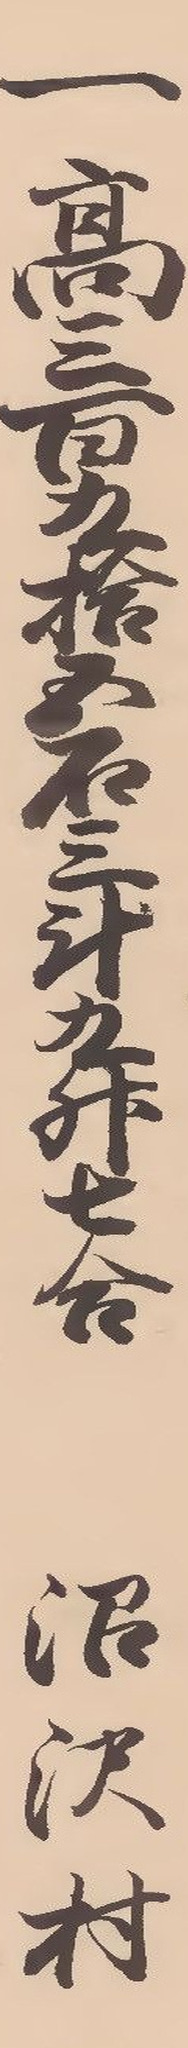一高三百九拾五石三斗九升七合沼沢村
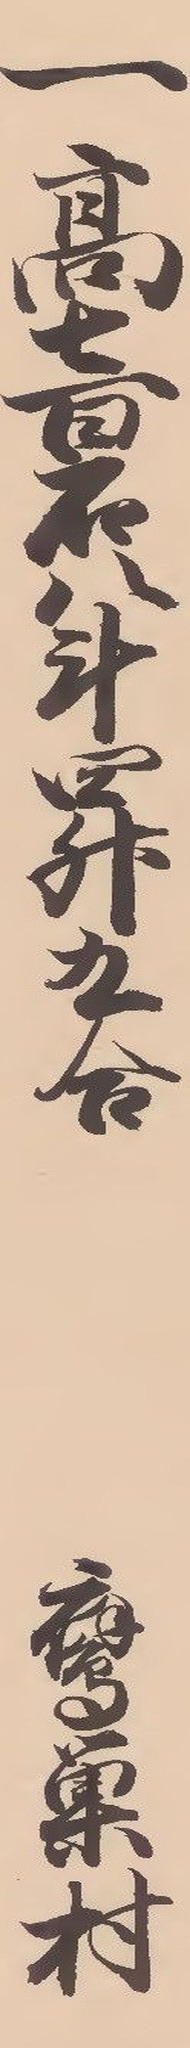一高七百石八斗四升九合鷹巣村
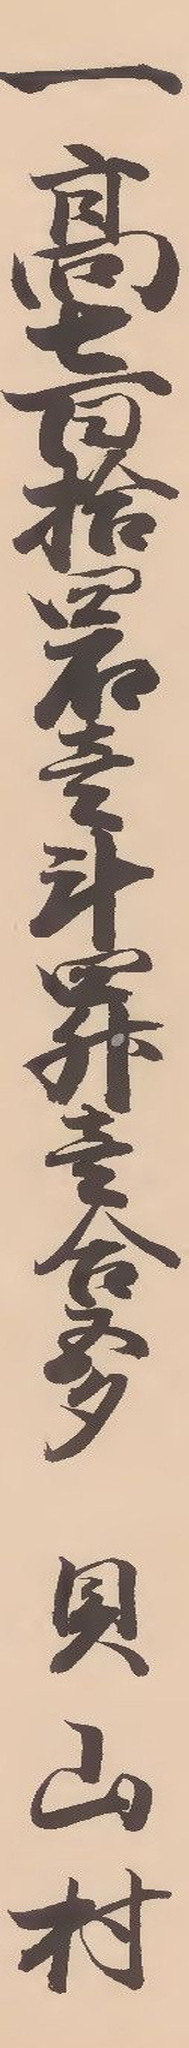一高七百拾四石壱斗四升壱合五勺貝山村
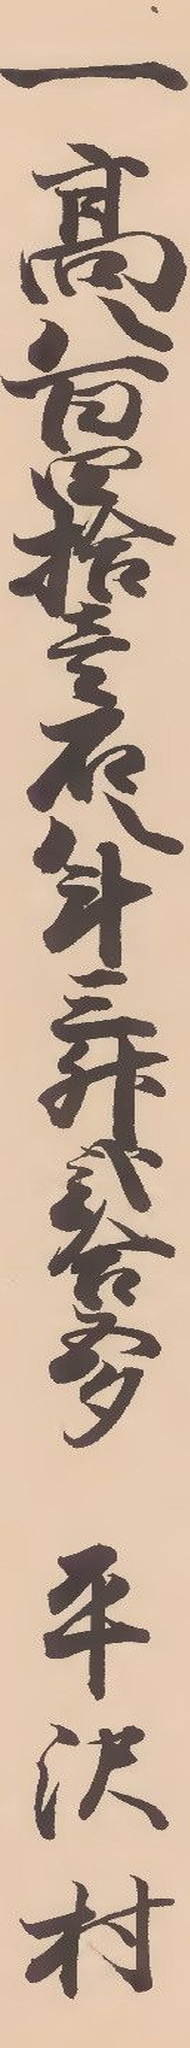一高八百四拾壱石八斗三升弐合五勺平沢村
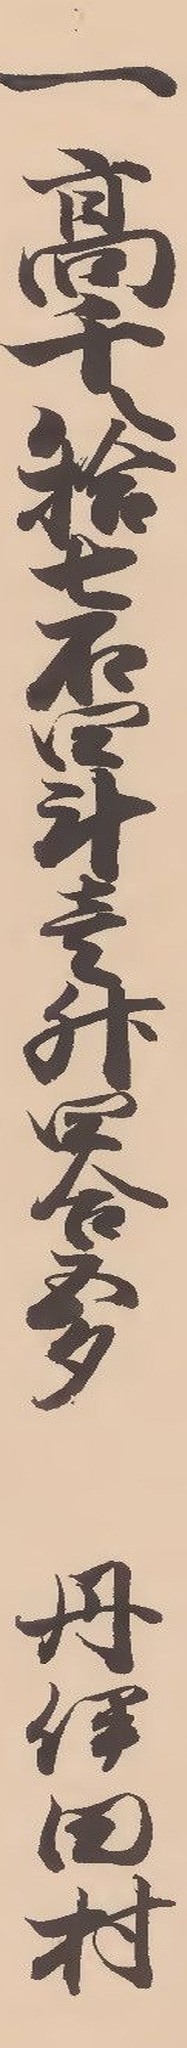一高千八拾七石四斗壱升四合五勺丹伊田村
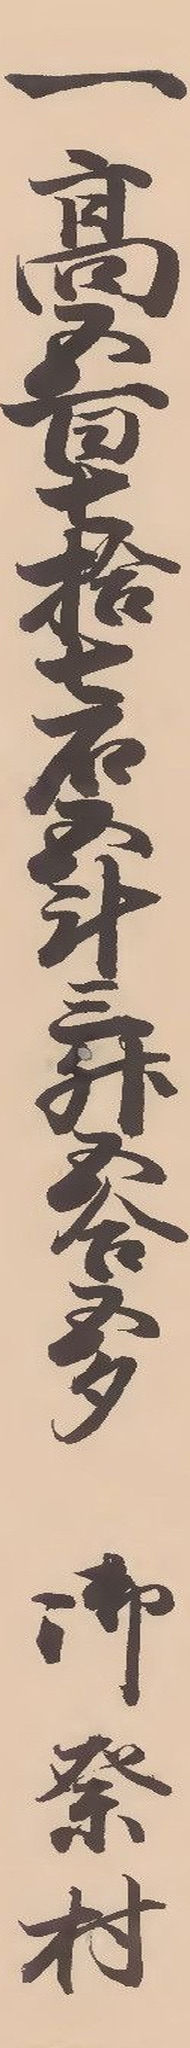一高五百七拾七石五斗三升五合五勺御祭村
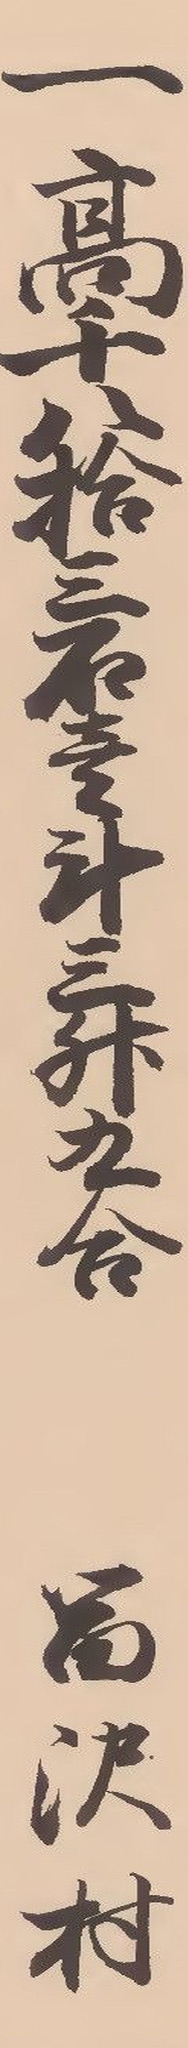一高千八拾三石壱斗三升九合富沢村
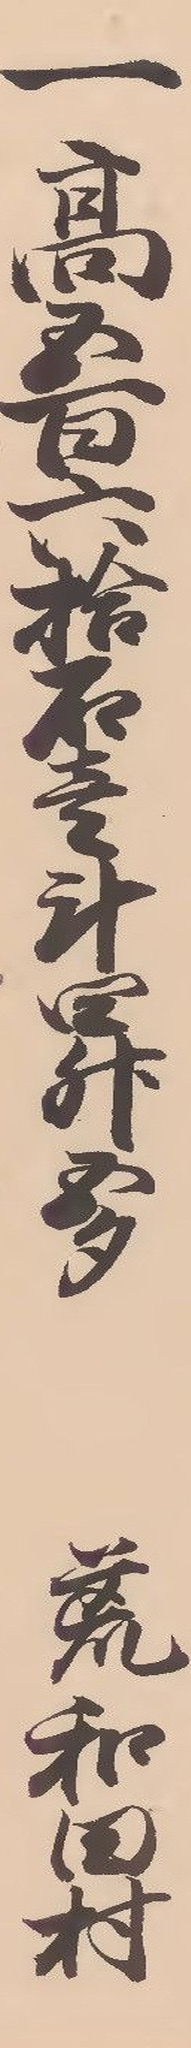一高五百六拾石壱斗四升五勺荒和田村

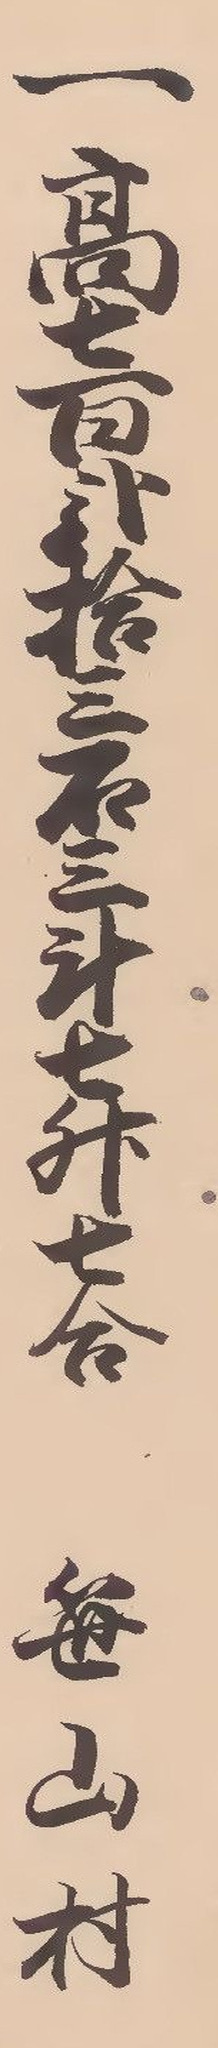一高七百弐拾三石三斗七升七合笹山村
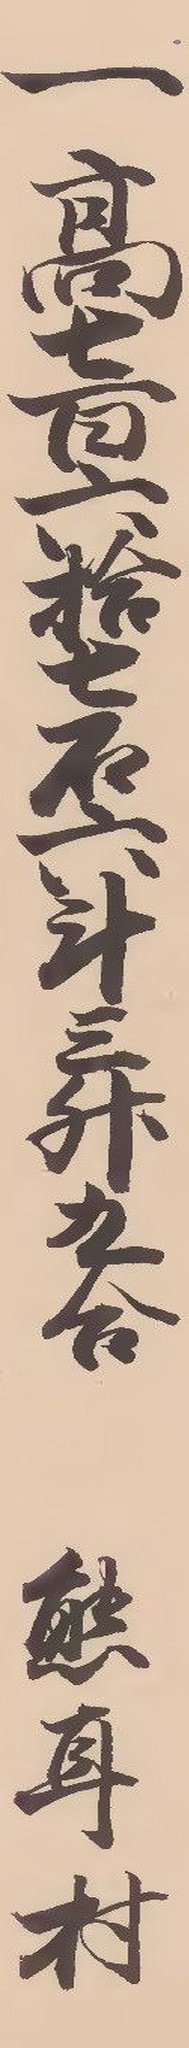一高七百六拾七石六斗三升九合熊耳村
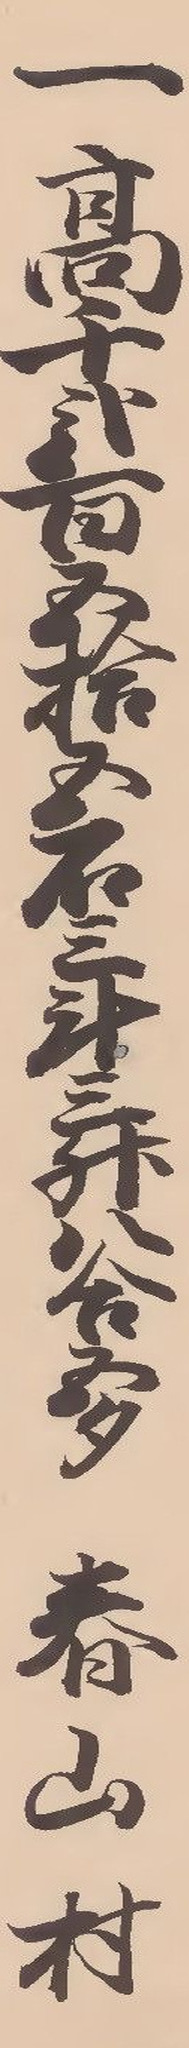一高千弐百五拾五石三斗三升八合五勺春山村
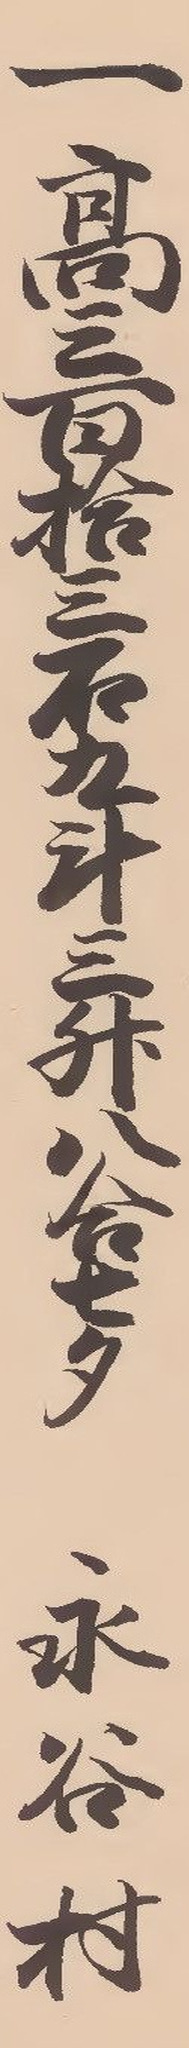一高三百拾三石九斗三升八合七勺永谷村
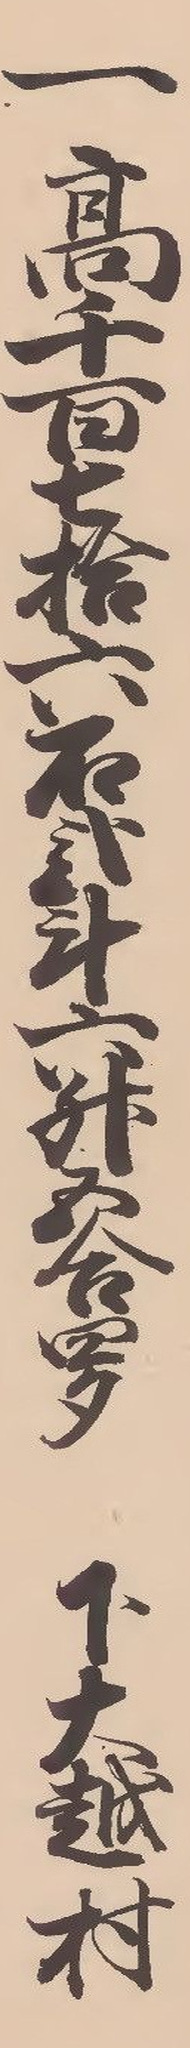一高千百七拾六石弐斗六升五合四勺下大越村
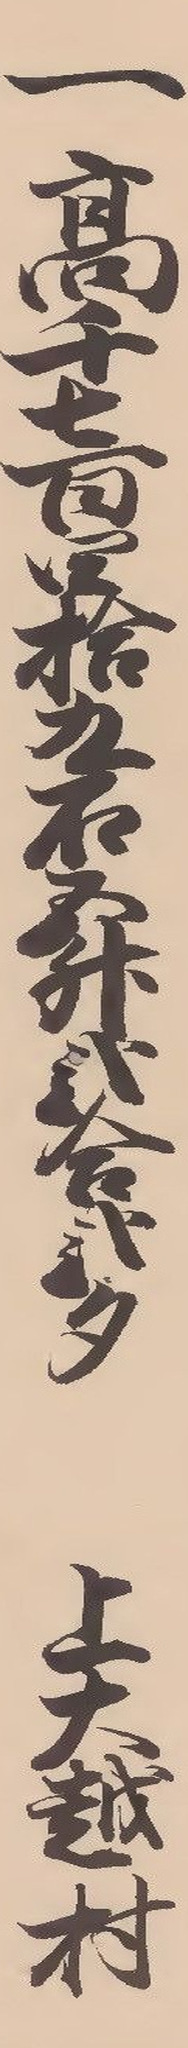一高千七百四拾九石五升弐合弐勺上大越村
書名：陸奥国郷帳　２
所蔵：国立公文書館 National Archives of Japan
